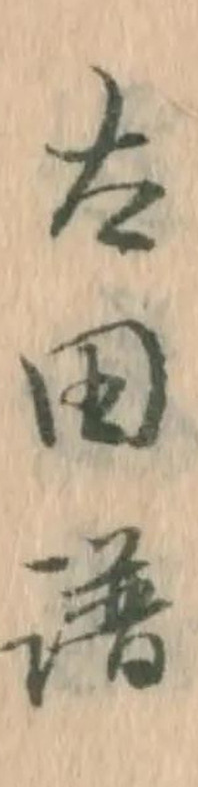太田譜
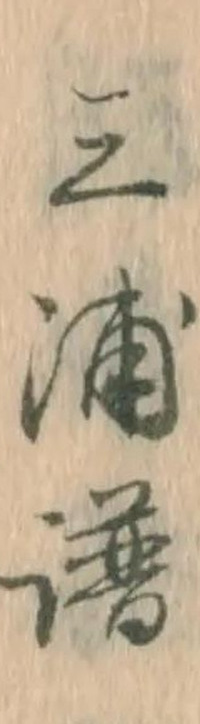三浦譜
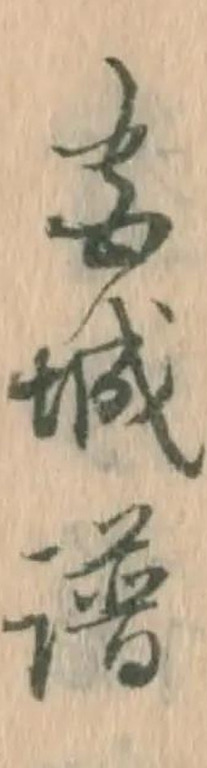宮城譜
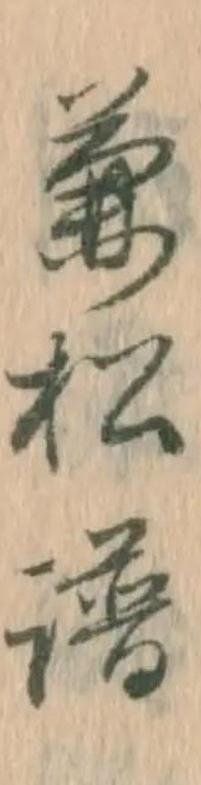兼松譜
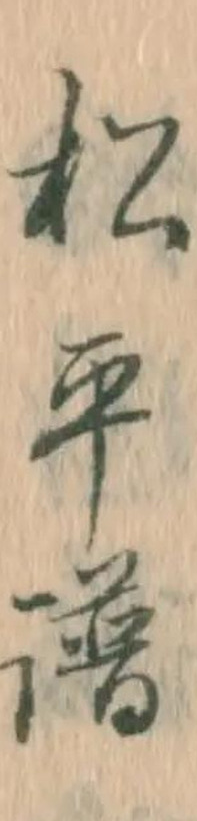松平譜
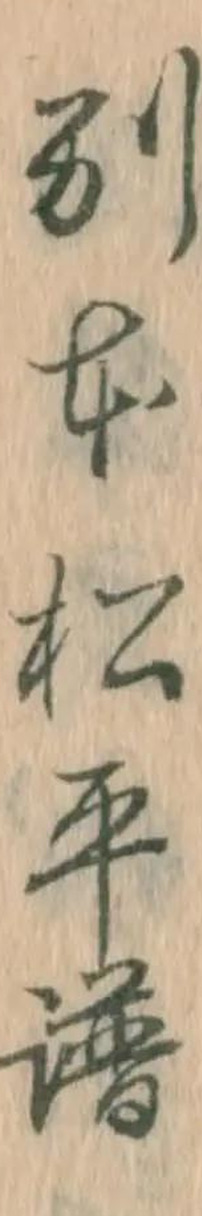別本松平譜
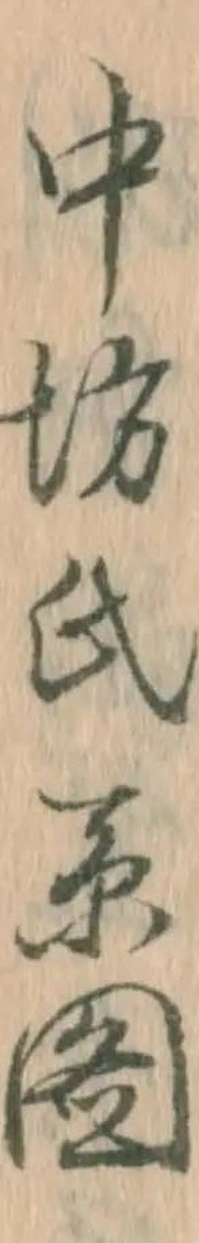中坊氏系図
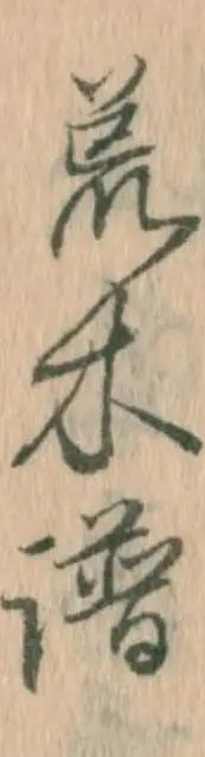荒木譜
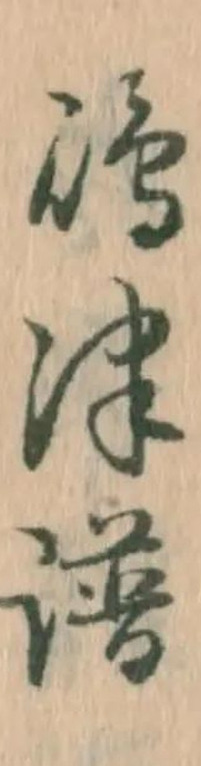島津譜
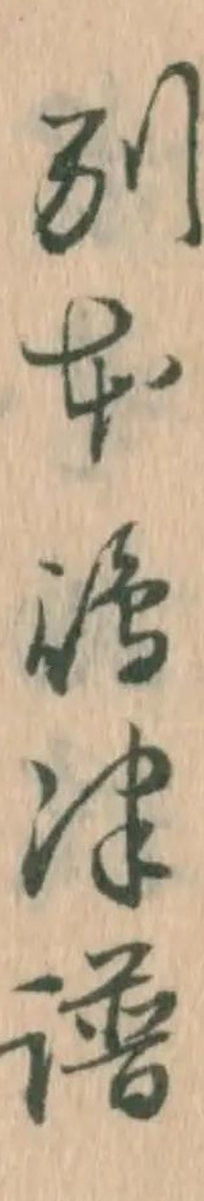別本島津譜
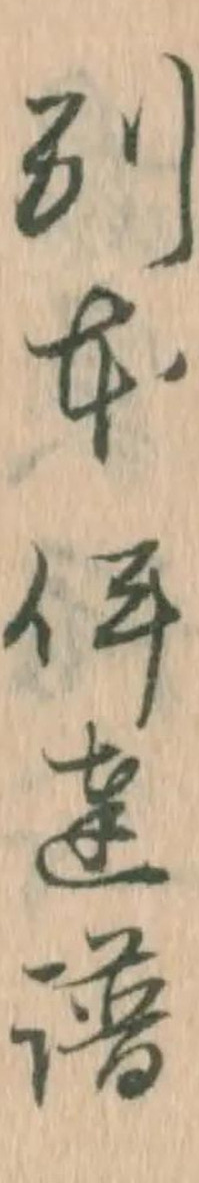別本伊達譜
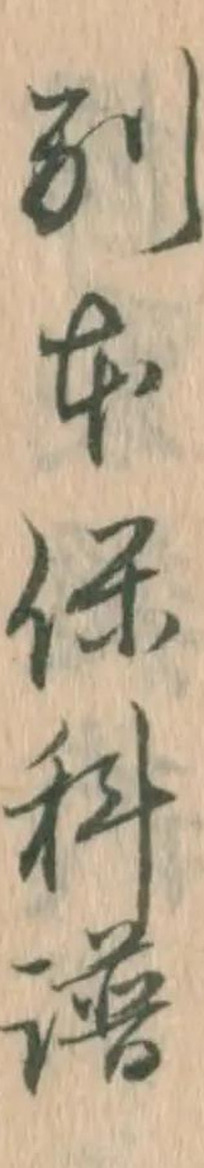別本保科譜
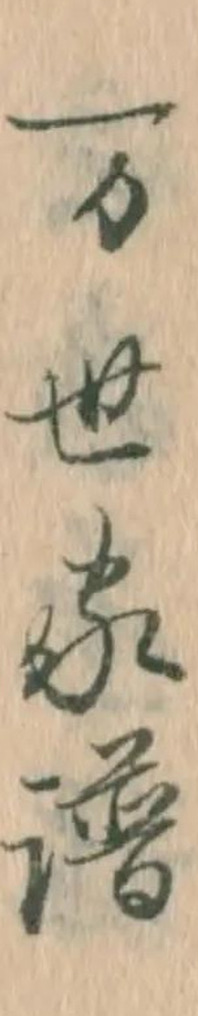万世家譜
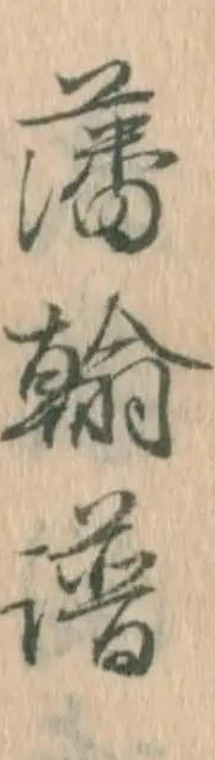藩翰譜
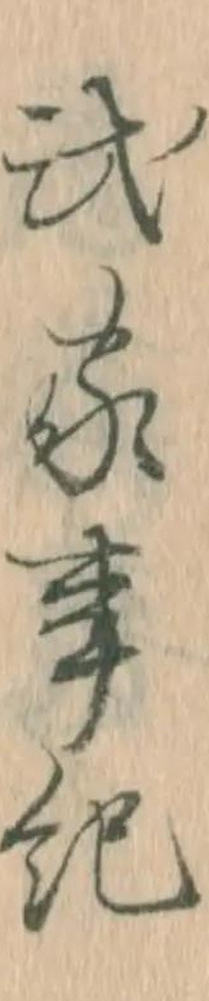武家事紀
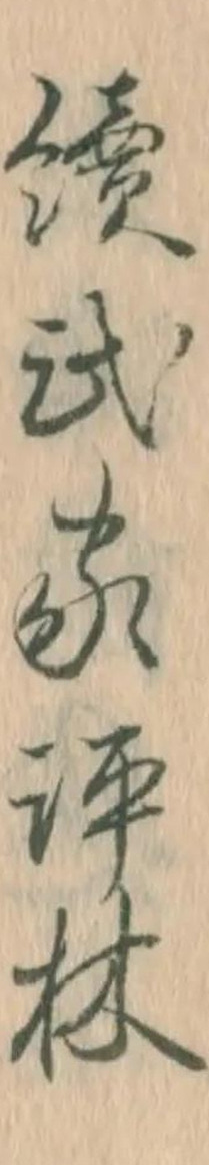続武家評林
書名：切支丹御退治記 49巻. [1]
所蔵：国立国会図書館 National Diet Library, JAPAN
